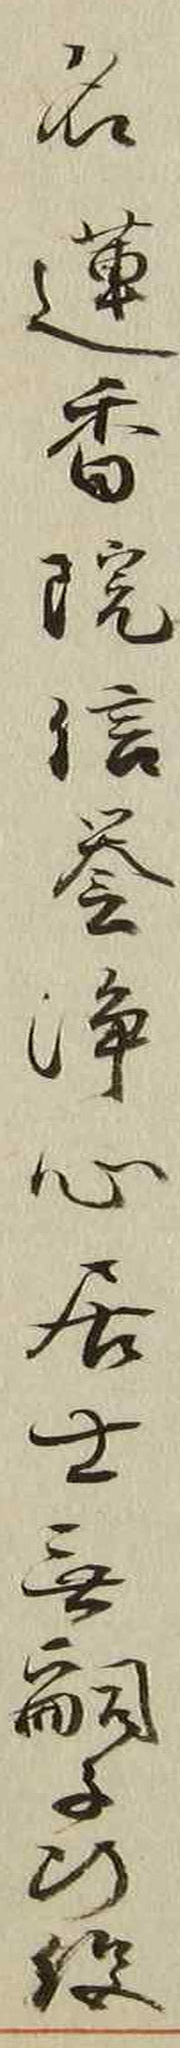名蓮香院信誉浄心居士無嗣子断絶
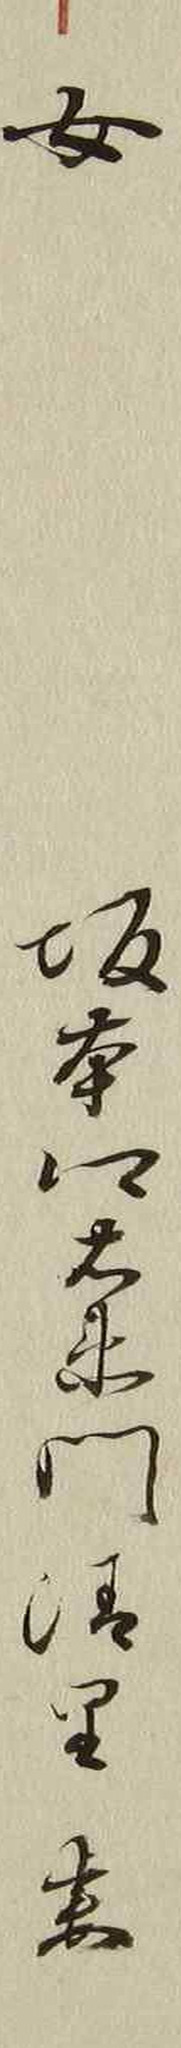女坂本郷右衛門清里妻
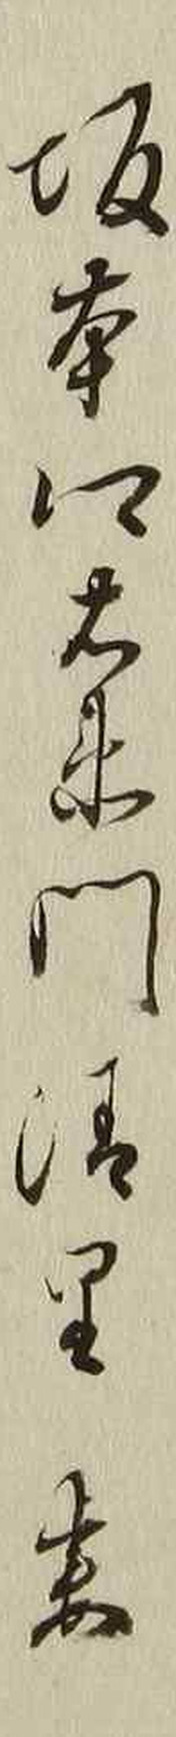女坂本郷右衛門清里妻
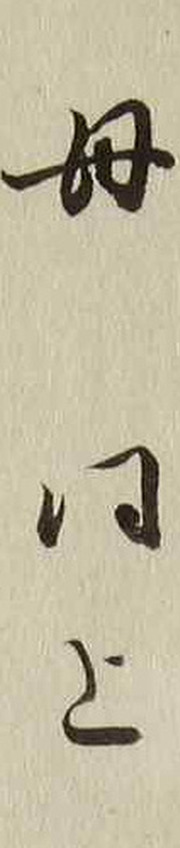母同上
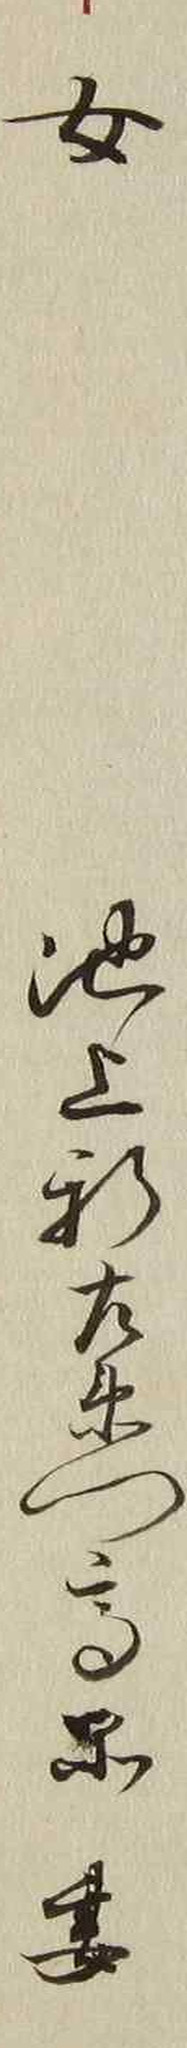女池上新左衛門高品妻
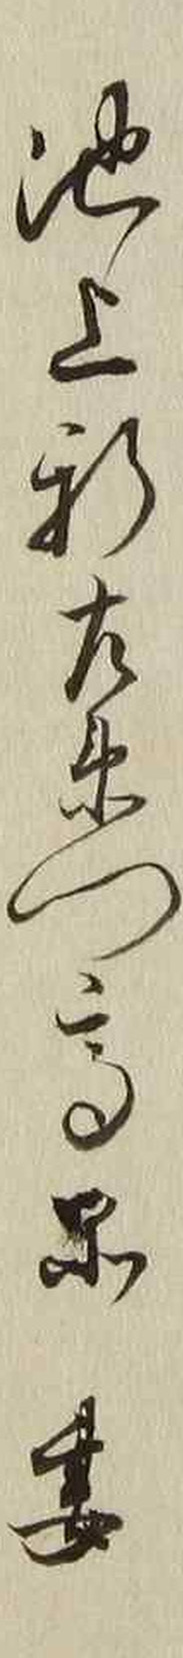女池上新左衛門高品妻
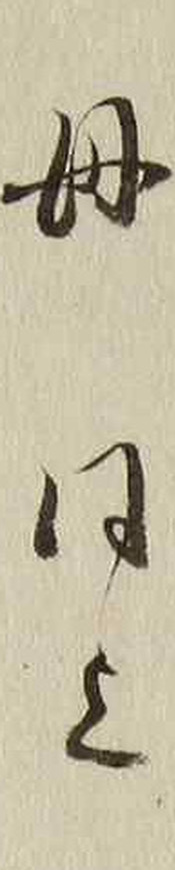母同上
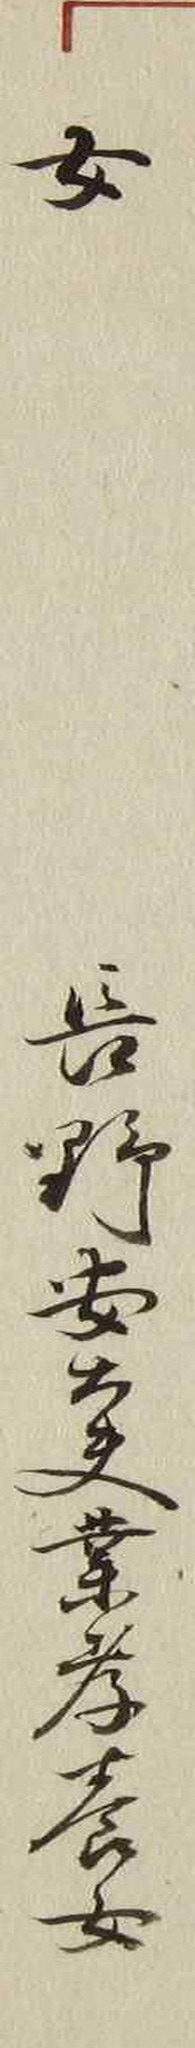女長野安大夫業孝養女
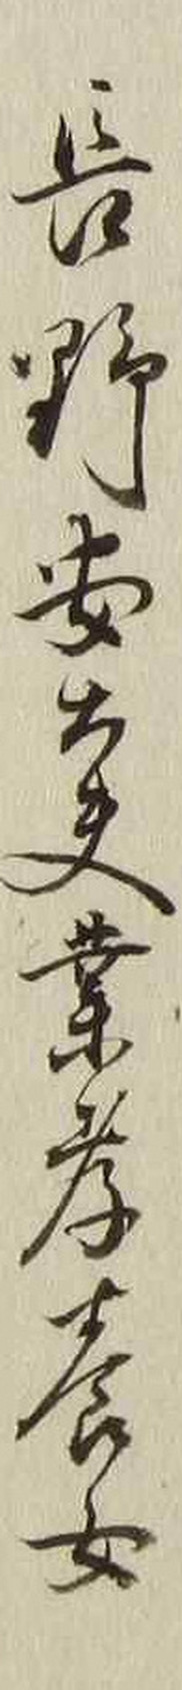女長野安大夫業孝養女
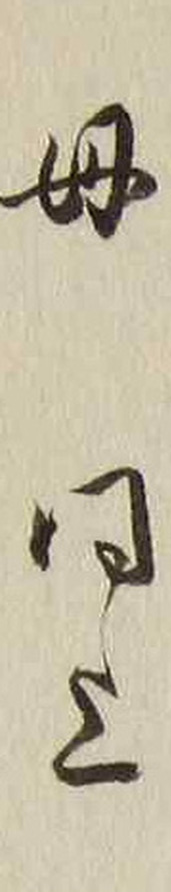母同上

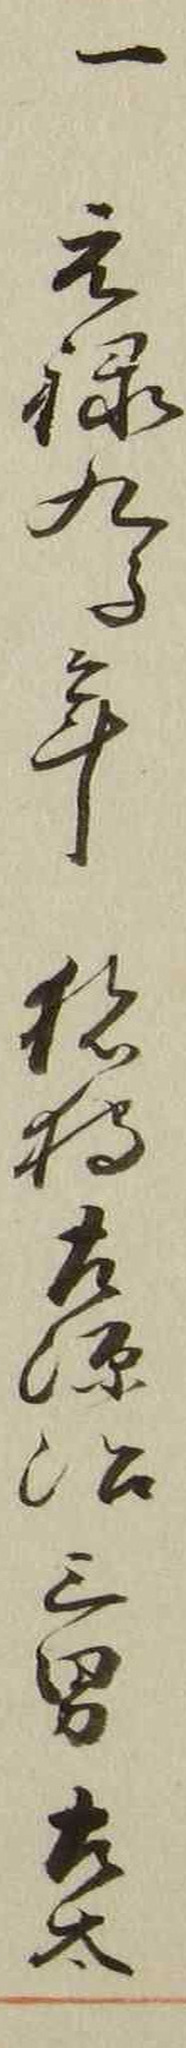一元禄九子年猪狩左源治三男左太
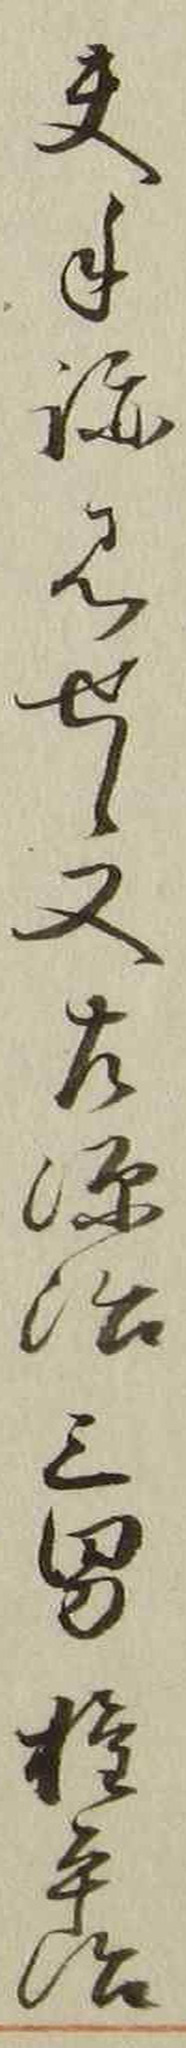夫手跡見せ候又左源治三男権平治
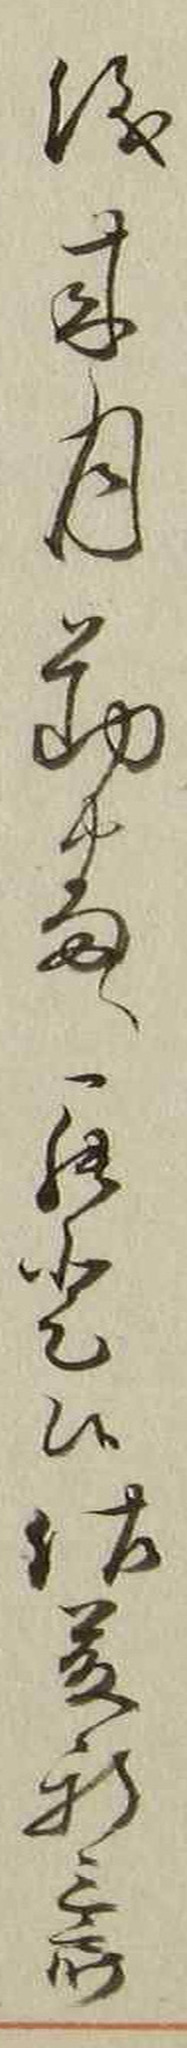儀来月勤番へ罷登候佐藤新三郎
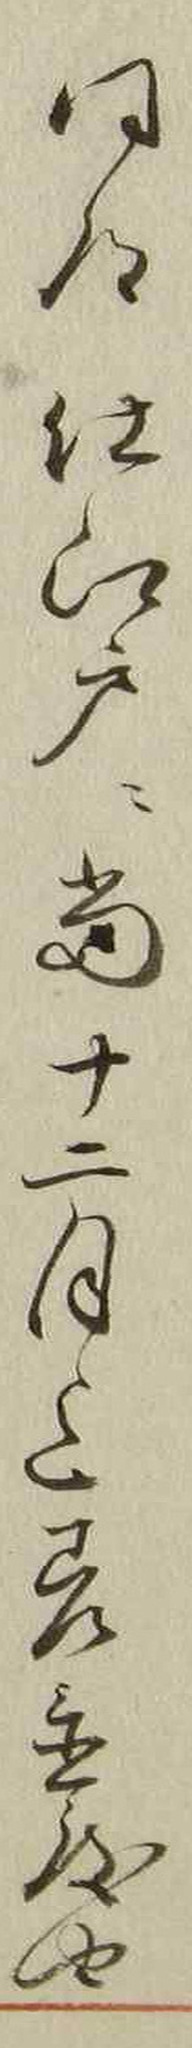同道仕江戸ニ当十二月迄差置度由
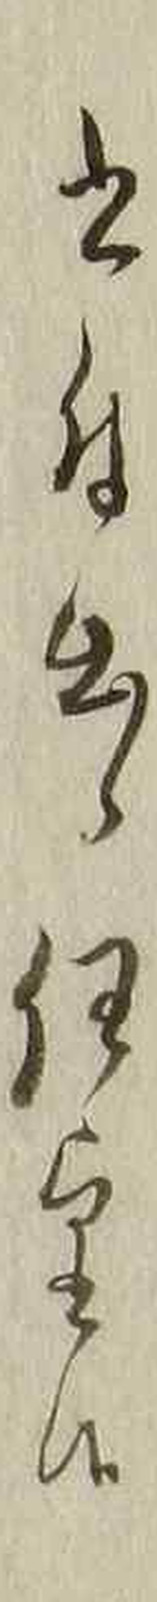書付出候任望候
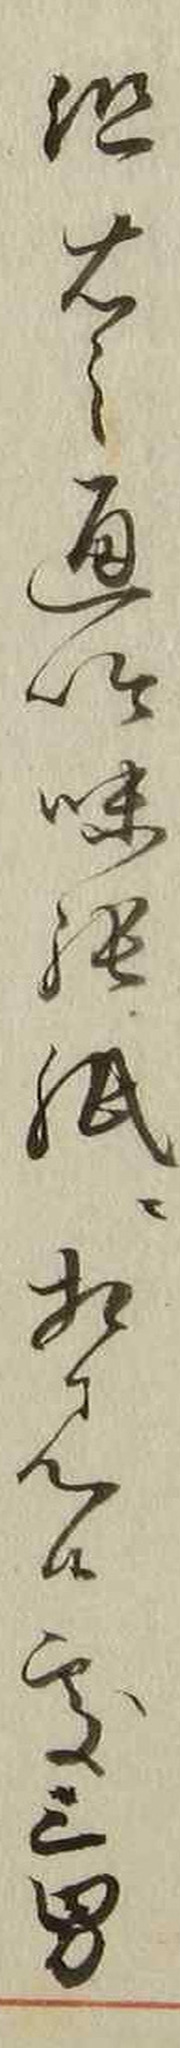但右之通吟味張紙ニ相見候処三男
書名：諸士系譜　巻之28　い之部28
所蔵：会津若松市立会津図書館
